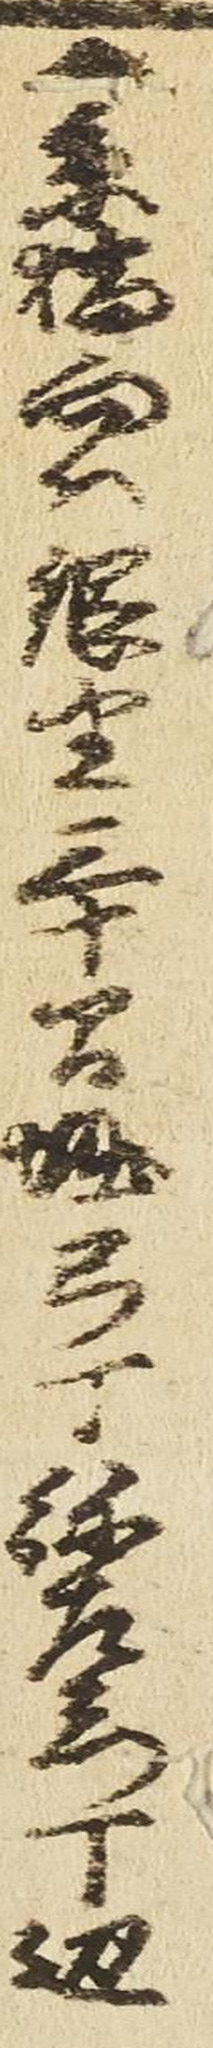▲京橋向は銀座三十軒堀弓丁弥左衛門丁辺
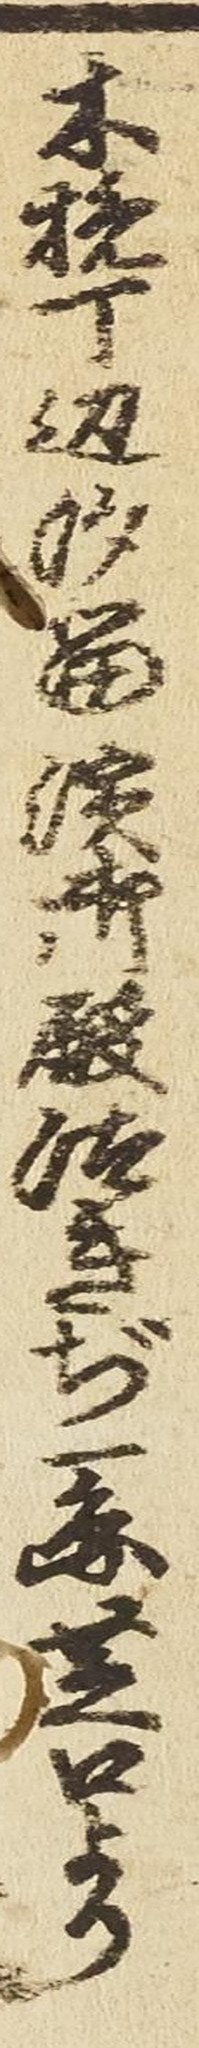木挽丁辺汐留浜御殿つきぢ一円芝口より
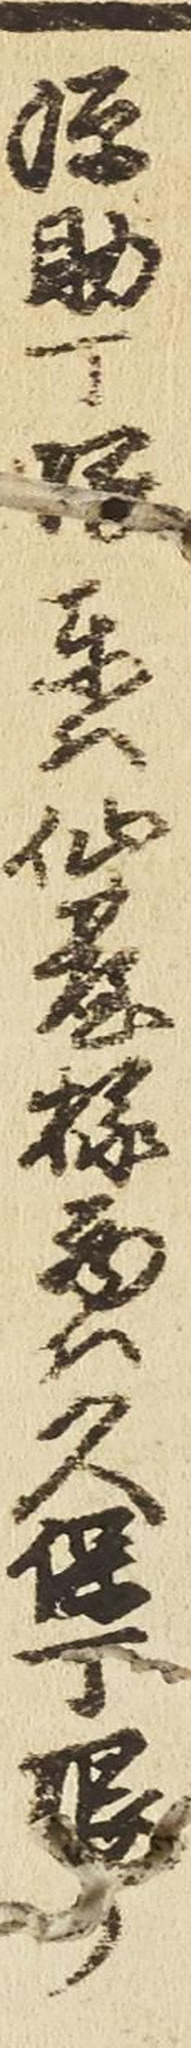源助丁限東は仙台様西は久保丁限り
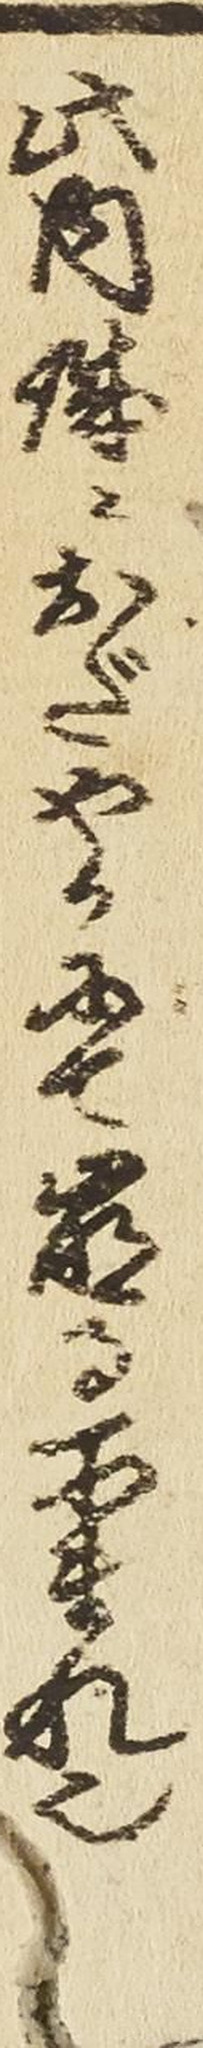此内誠ニおだやかにて崩る所まれ也
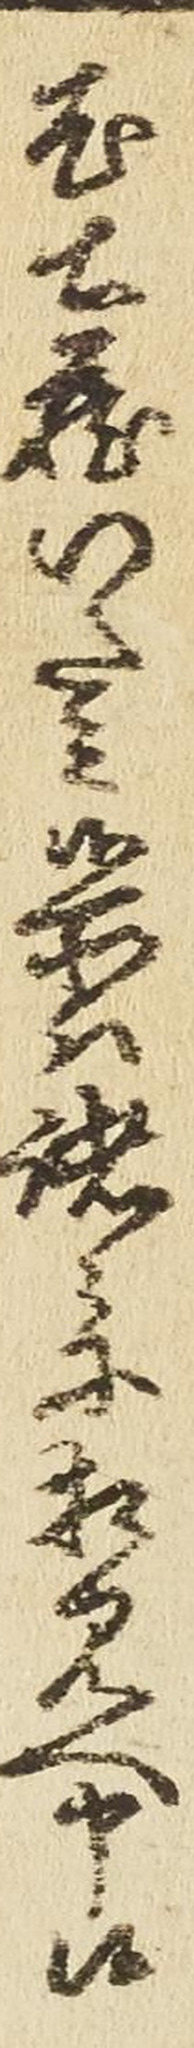尤土蔵いたみ候所は諸々に相見へ申候
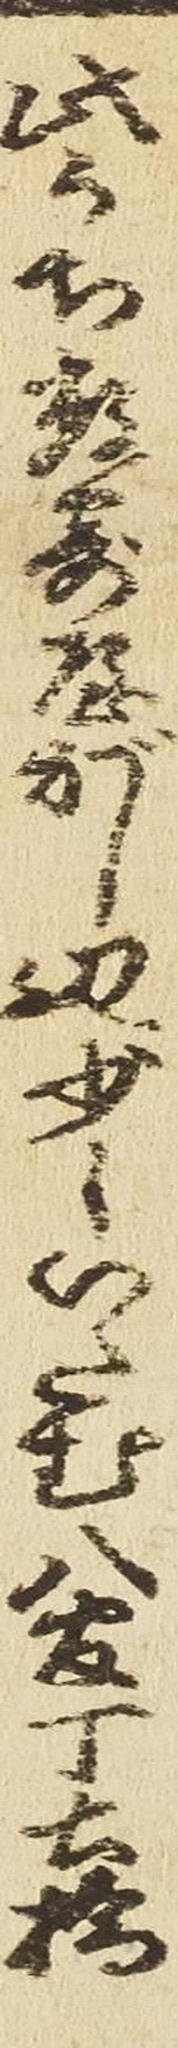此うち数寄屋がし辺少しいたむ八官丁土橋
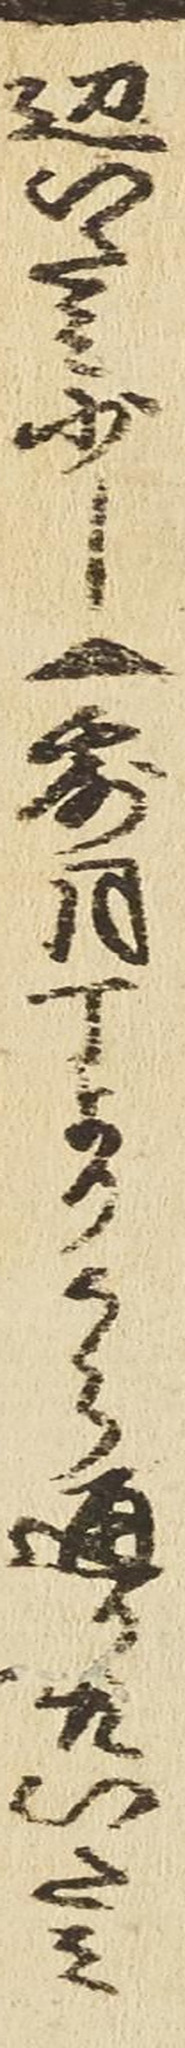辺いたみ少し▲霜月丁よりうら通り共いたみ
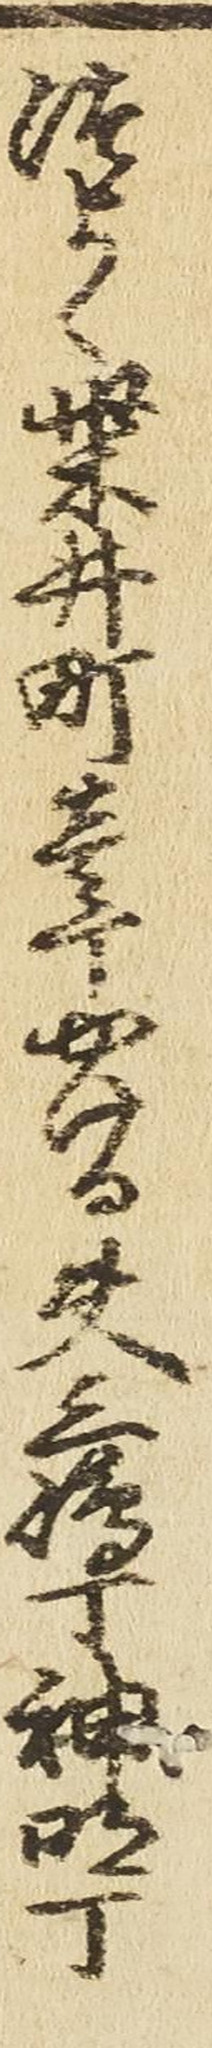つよく柴井町壱丁やける夫三嶋丁神明丁
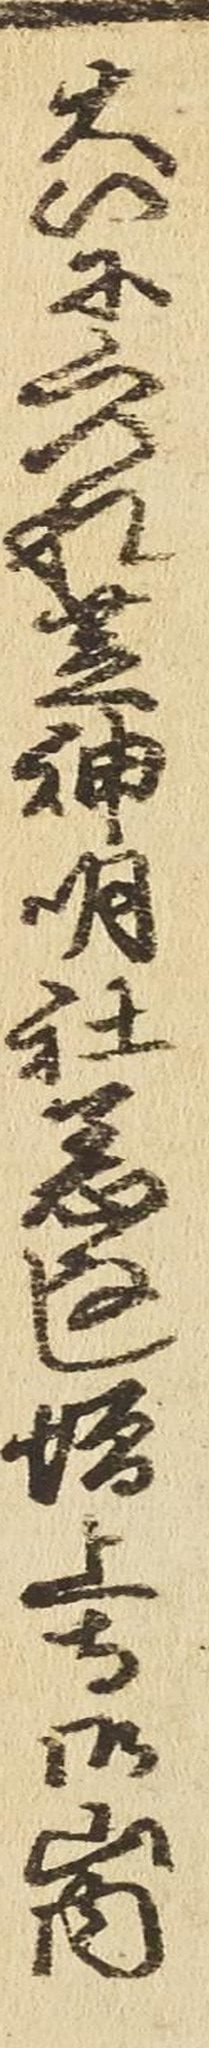大いにくつれ芝神明社恙なし増上寺御山内
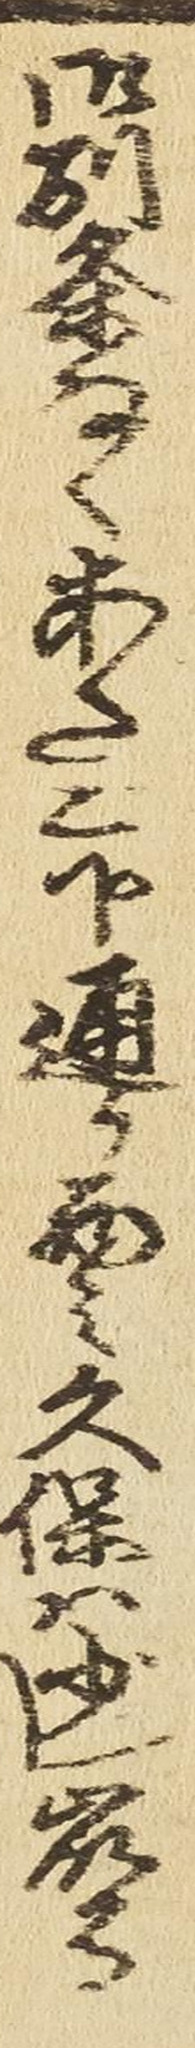御別条なくあたこ下通り西之久保は少し崩る
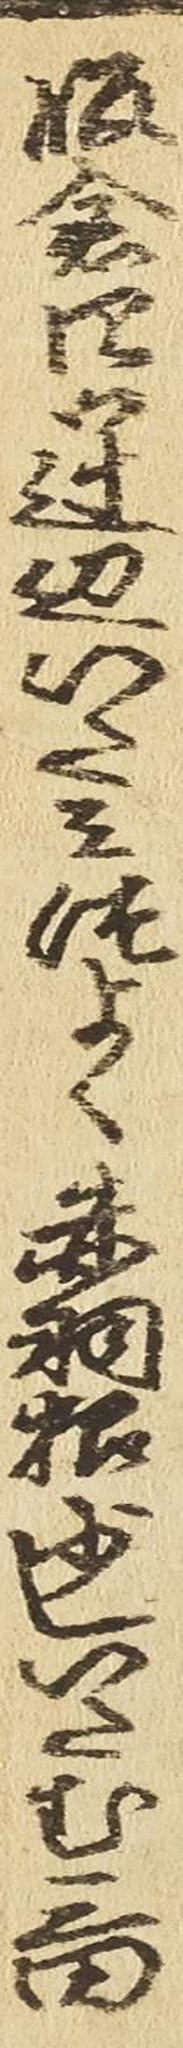飯倉四ツ辻いたみつよく赤羽根少しいたむ三田
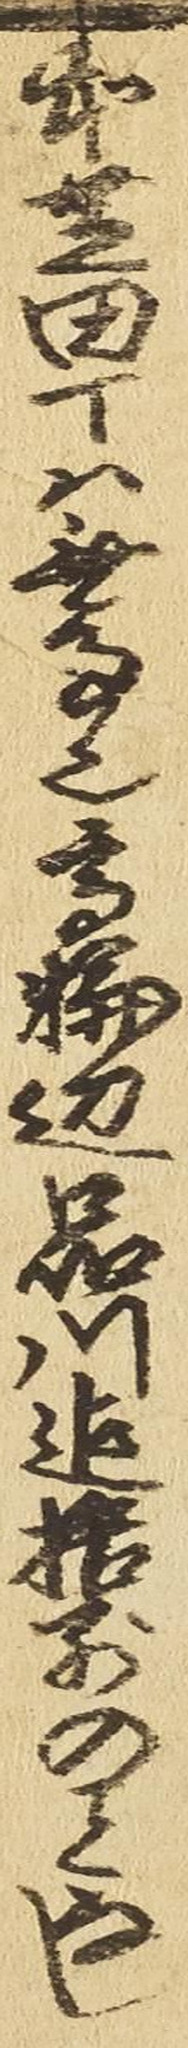本芝田丁は無事也高輪辺品川迄格別のことなし
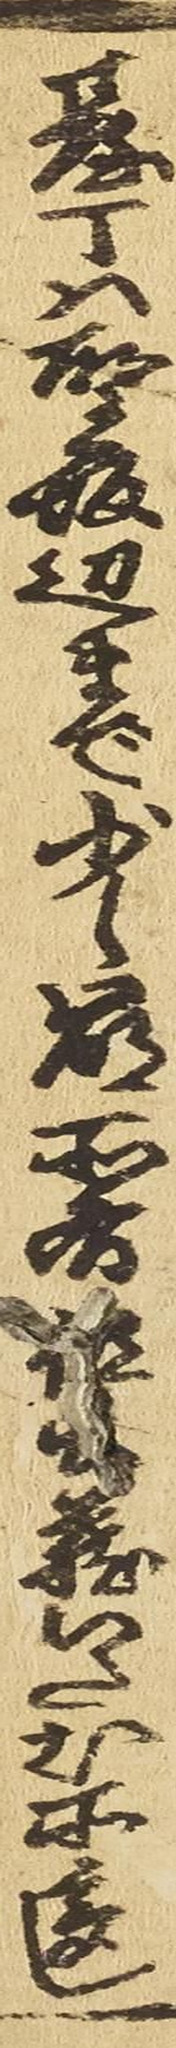台丁は聖坂辺まで少し崩所有但土蔵いたむ所多し

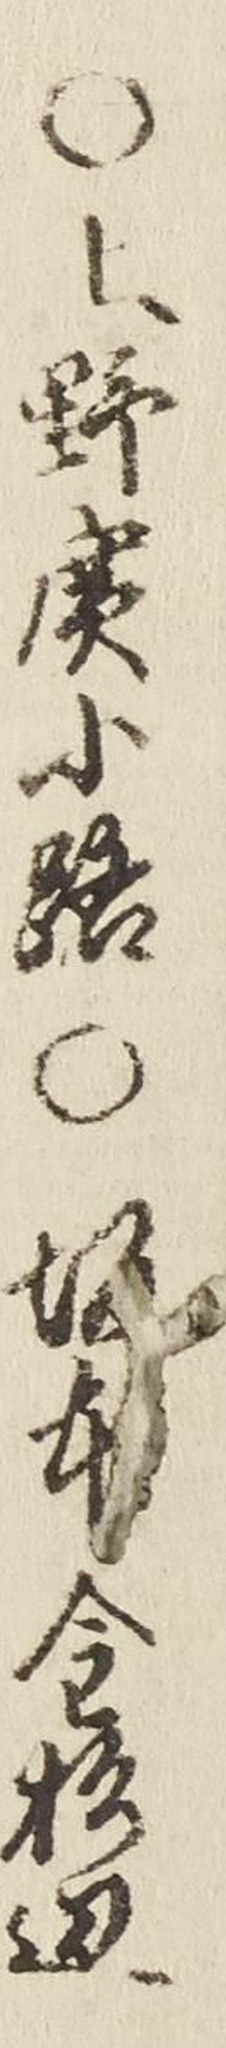第六○上野広小路○坂本金杉辺
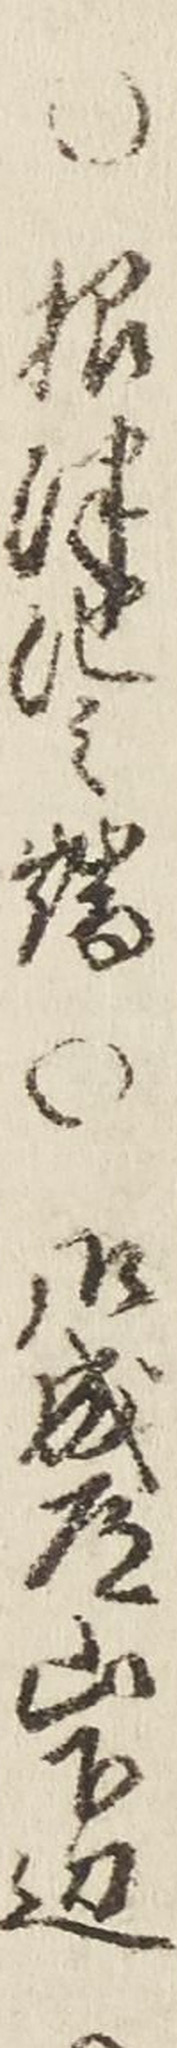○根津池之端○御成道山下辺
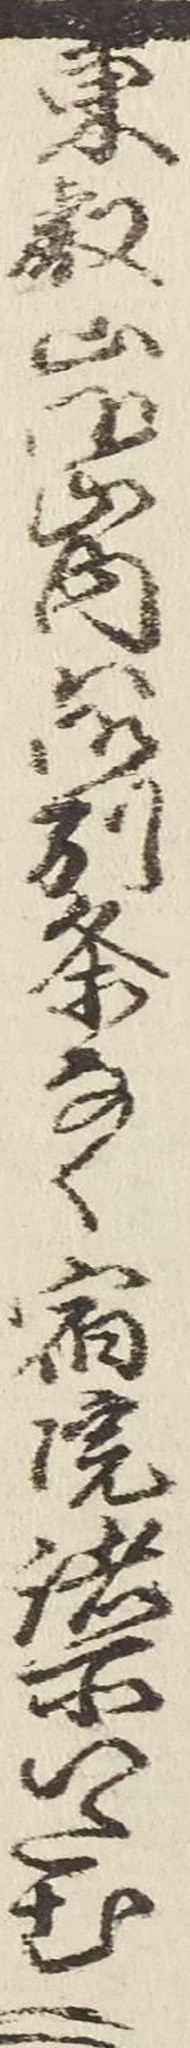東叡山御山内は御別条なく宿院諸所いたむ
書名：江戸みやげ
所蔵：東京大学地震研究所図書室 Earthquake Research Institute Library, The University of Tokyo, JAPAN
